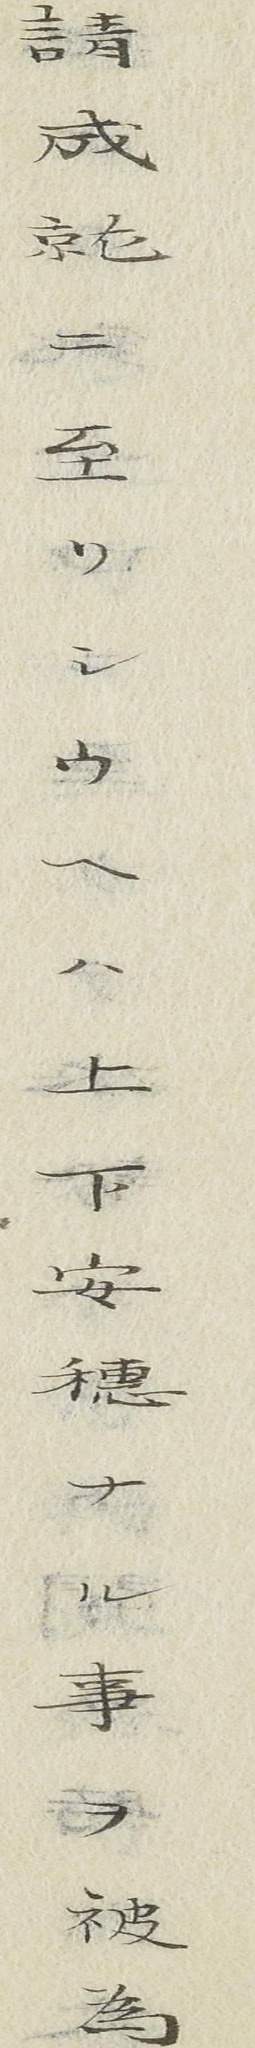請成就ニ至リシウヘハ上下安穂ナル事ヲ被為
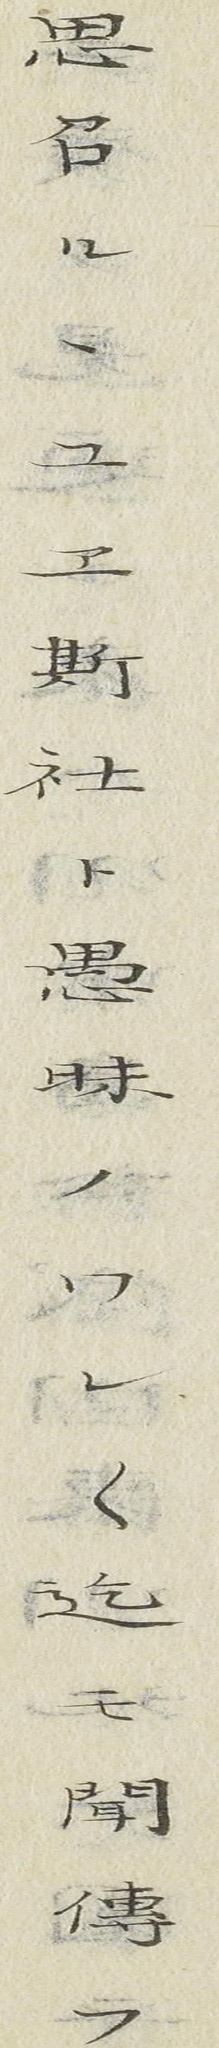思召ルヽユエ斯社ト愚昧ノワレ〱迄モ聞伝フ
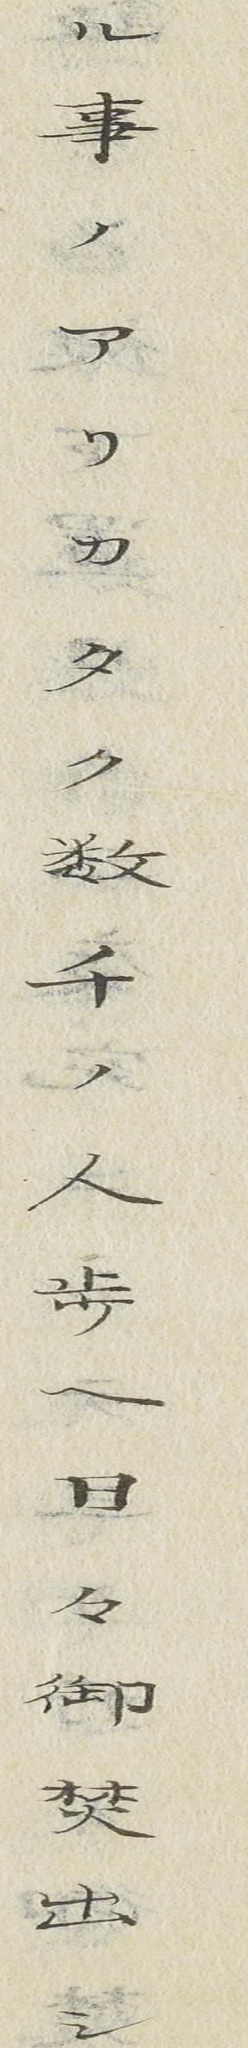ル事ノアリカタク数千ノ人歩ヘ日々御焚出シ
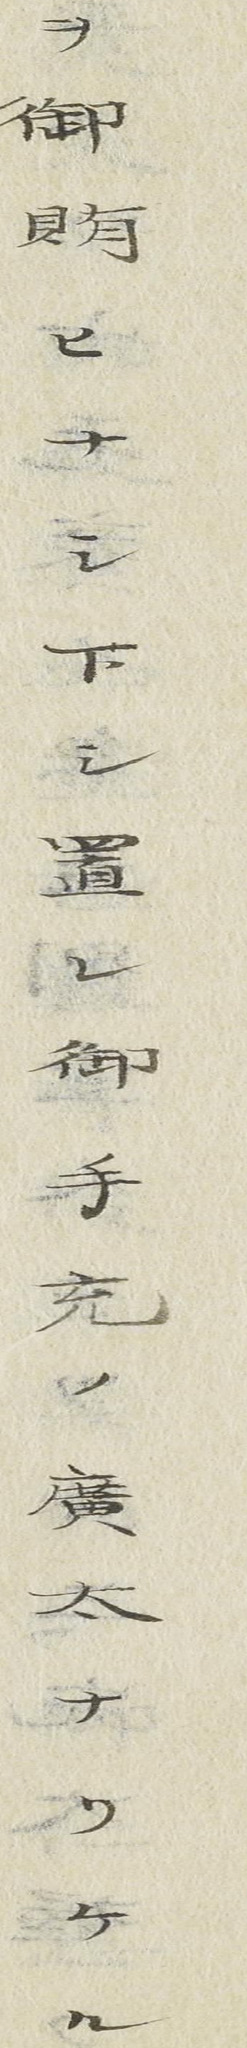ヲ御賄ヒナシ下シ置レ御手充ノ広太ナリケル
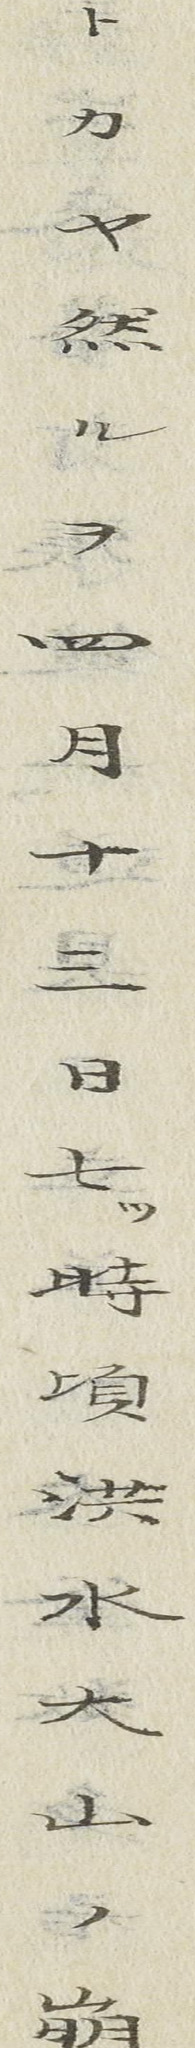トカヤ然ルヲ四月十三日七ツ時頃洪水大山ノ崩
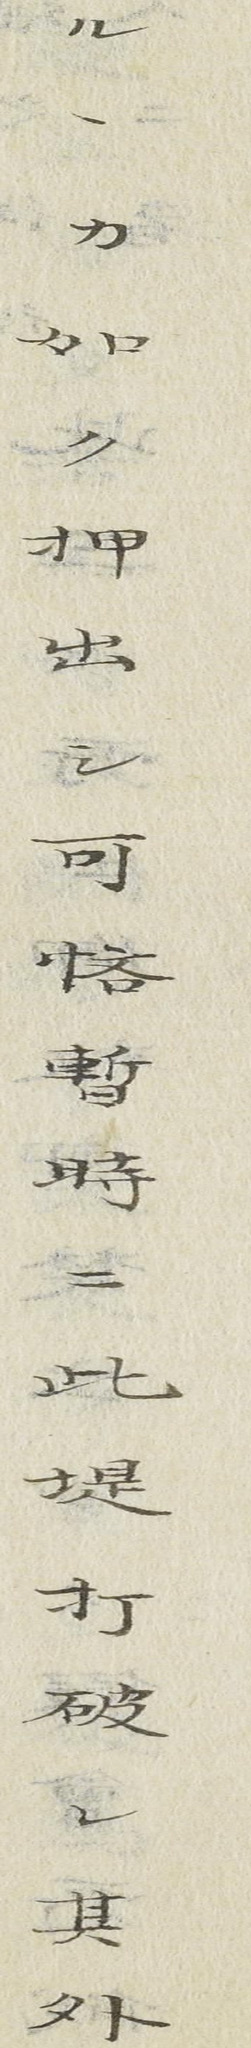ルヽカ如ク押出シ可悋暫時ニ此堤打破レ其外
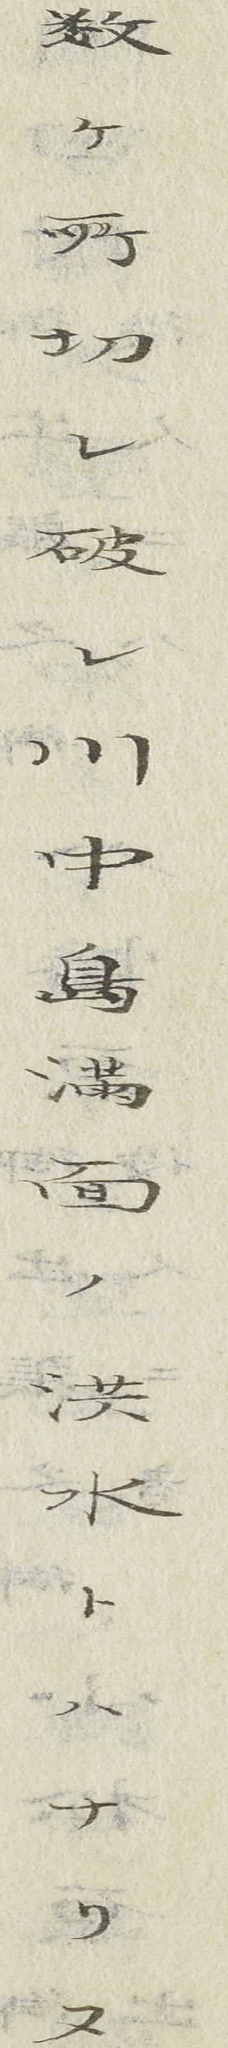数ケ所切レ破レ川中島満面ノ洪水トハナリヌ
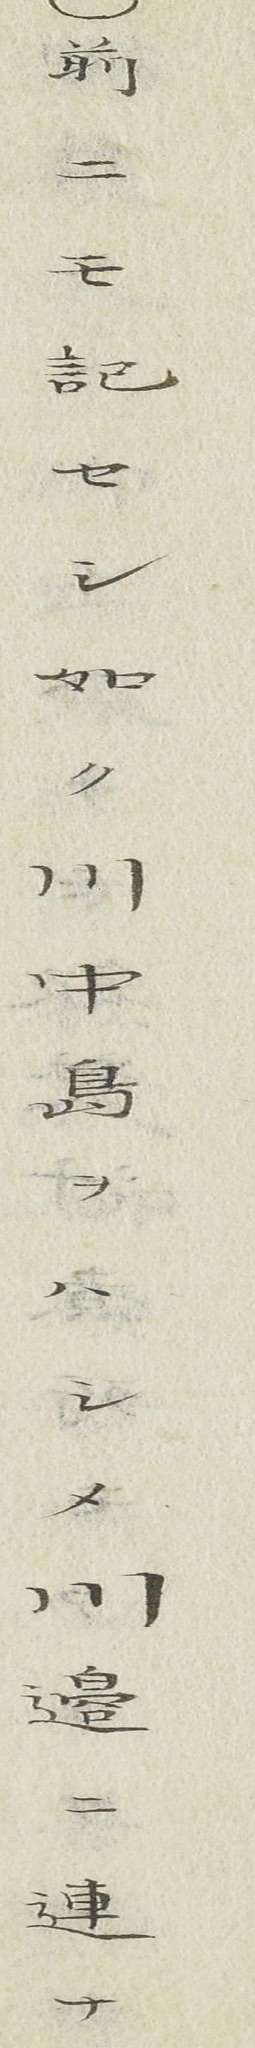〇前ニモ記セシ如ク川中島ヲハシメ川辺ニ連ナ
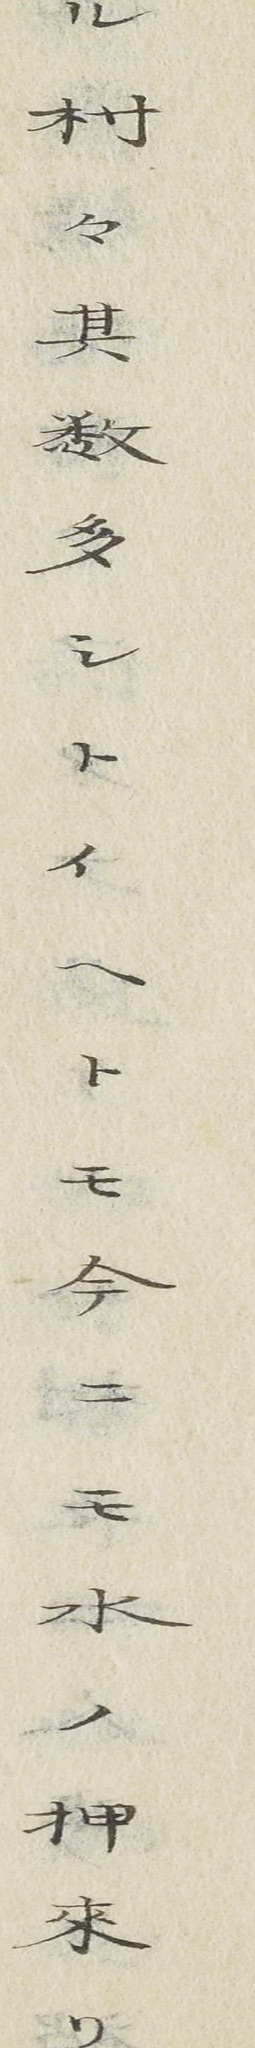ル村々其数多シトイヘトモ今ニモ水ノ押来リ
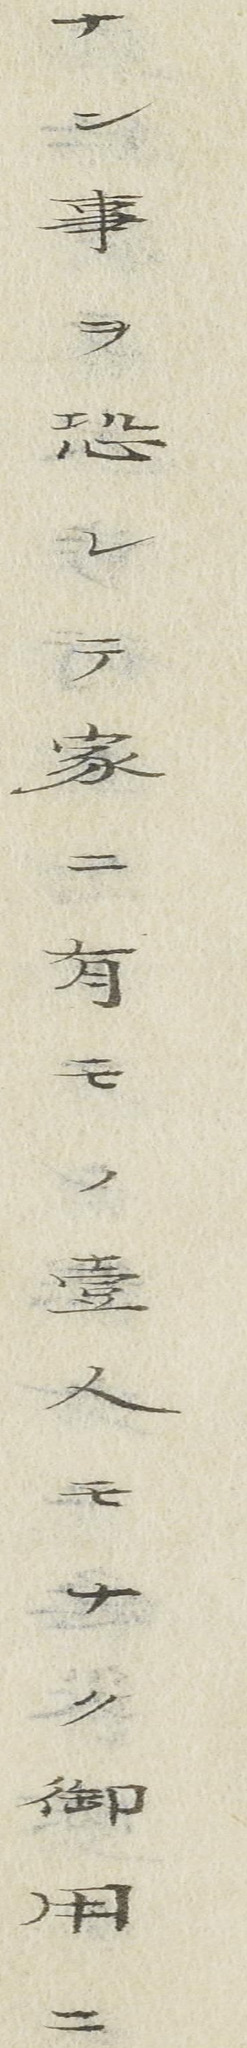ナン事ヲ恐レテ家ニ有モノ一人モナク御用ニ
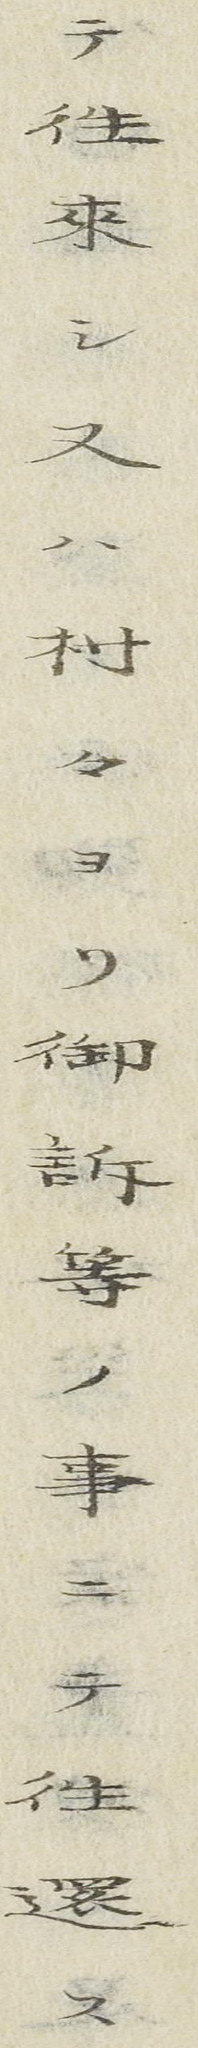テ往来シ又ハ村々ヨリ御訴等ノ事ニテ往還ス
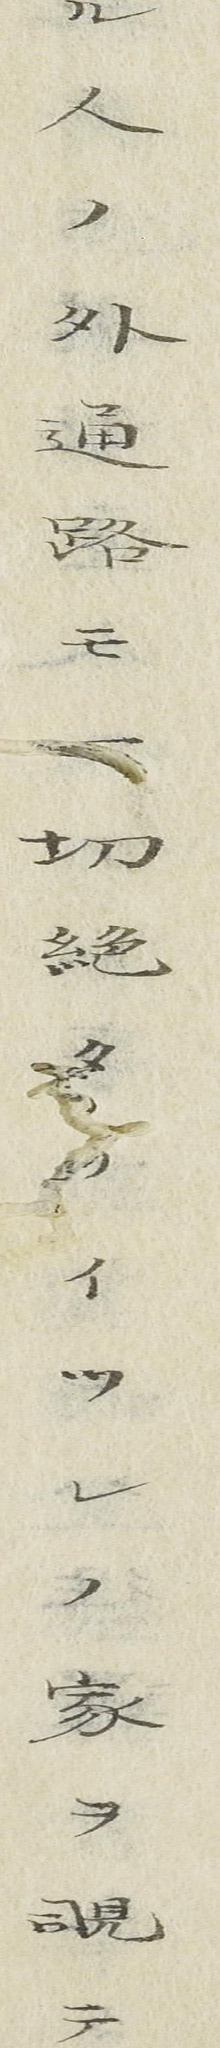ル人ノ外通路モ一切絶タリイツレノ家ヲ覗テ

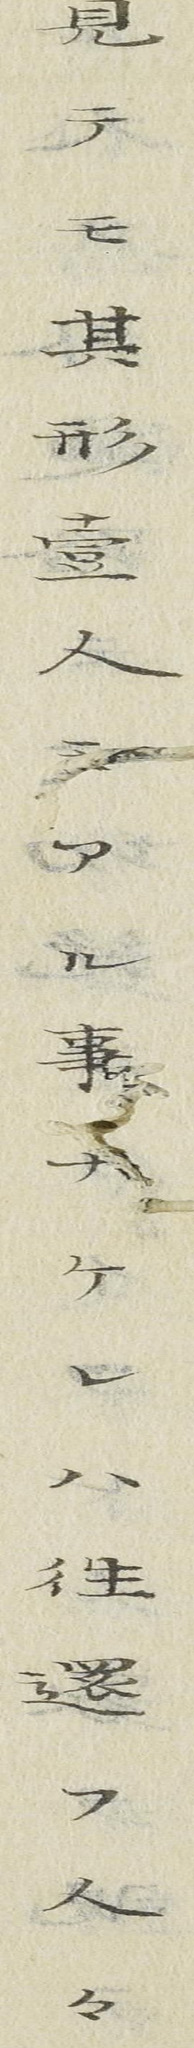見テモ其形一人モアル事ナケレハ往還フ人々
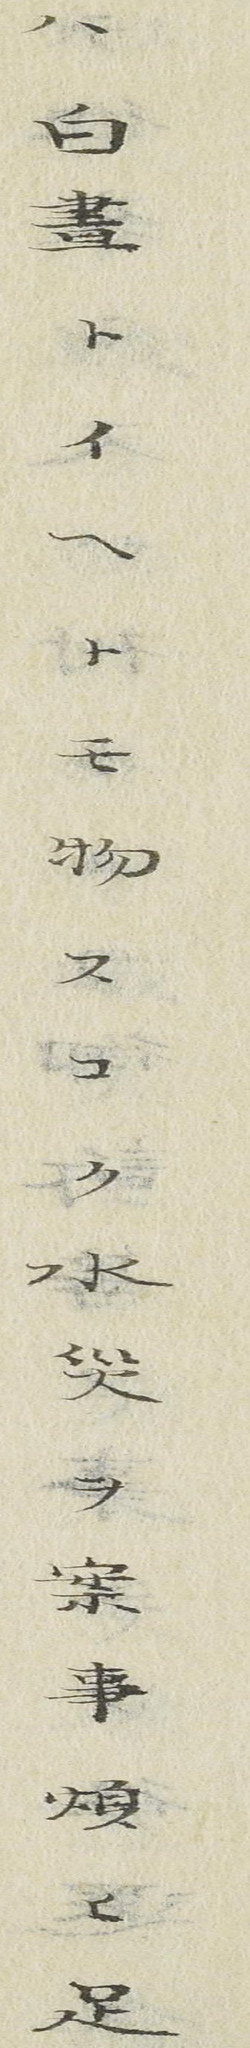ハ白昼トイヘトモ物スコク水災ヲ案事煩ヒ足
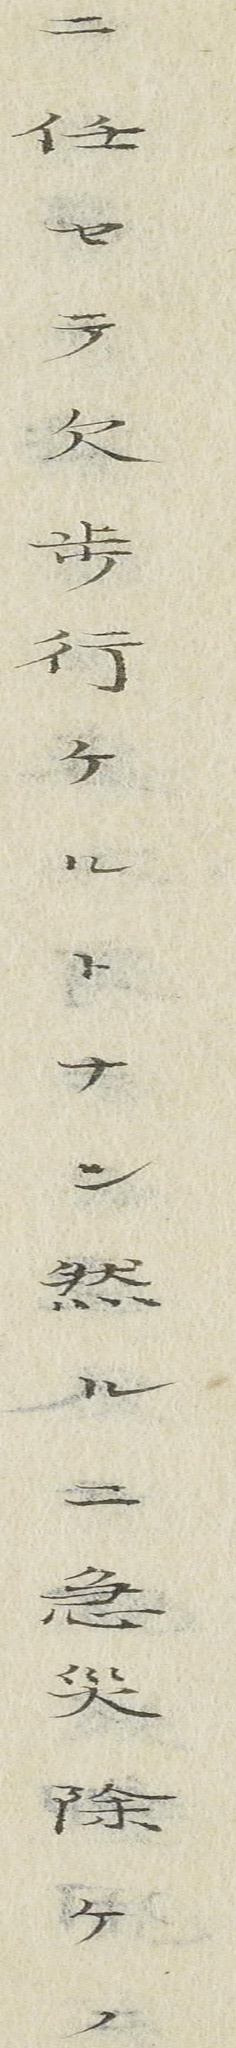ニ任セテ欠歩行ケルトナン然ルニ急災除ケノ
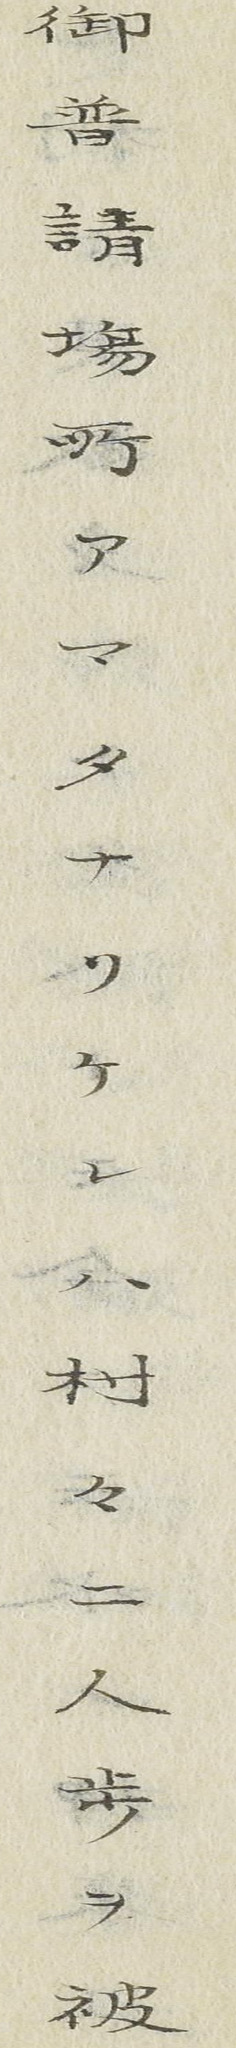御普請場所アマタナリケレハ村々ニ人歩ヲ被
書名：地災撮要　地震之部　巻ノ二
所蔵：東京大学地震研究所図書室 Earthquake Research Institute Library, The University of Tokyo, JAPAN
